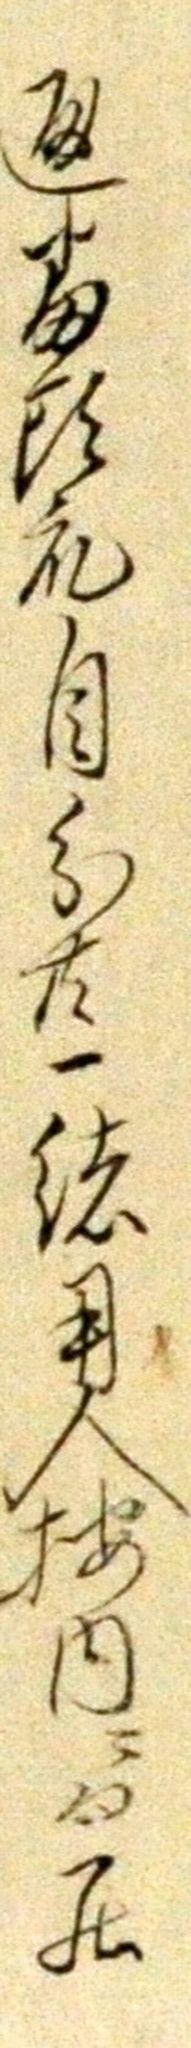通番頭衆自分共一緒用人案内ニ而罷
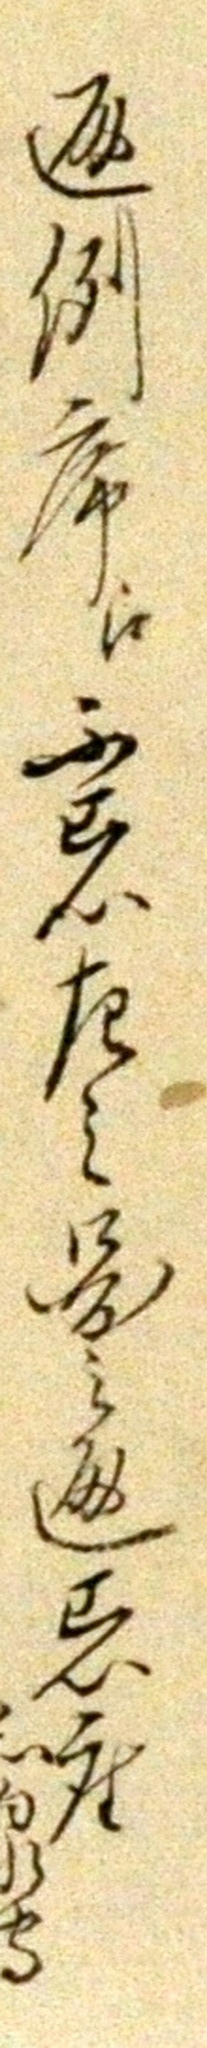通例席え不着左之図之通着座和泉守
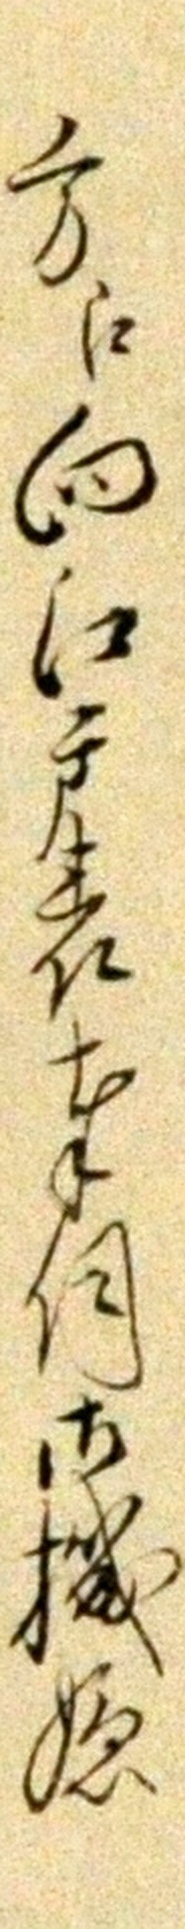方え向江戸表奉伺御機嫌
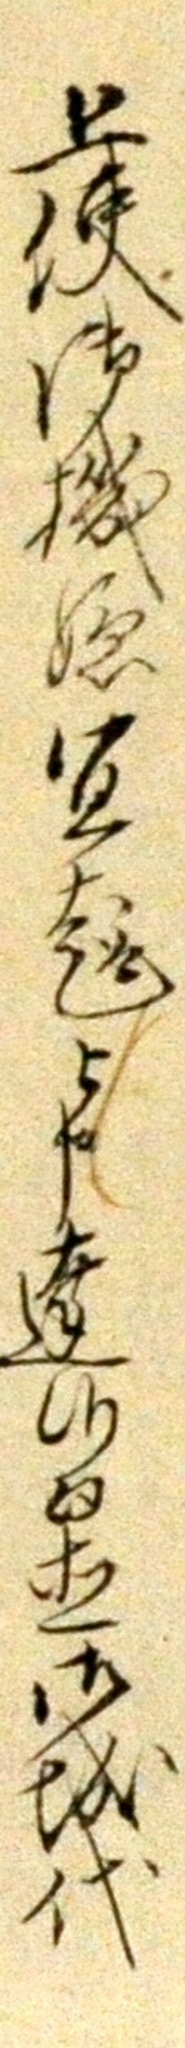上使御機嫌宜趣被申達候而直御城代
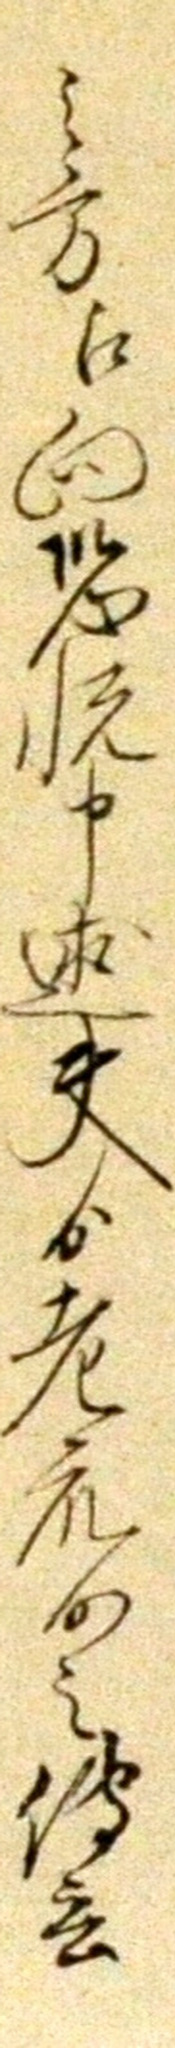之方え向恐悦申述夫ゟ老衆分之伝言
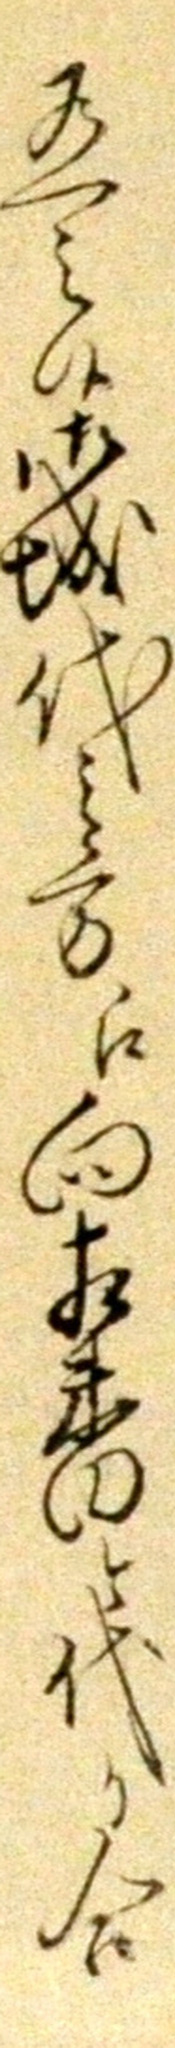有之候御城代之方え向相番と代り合
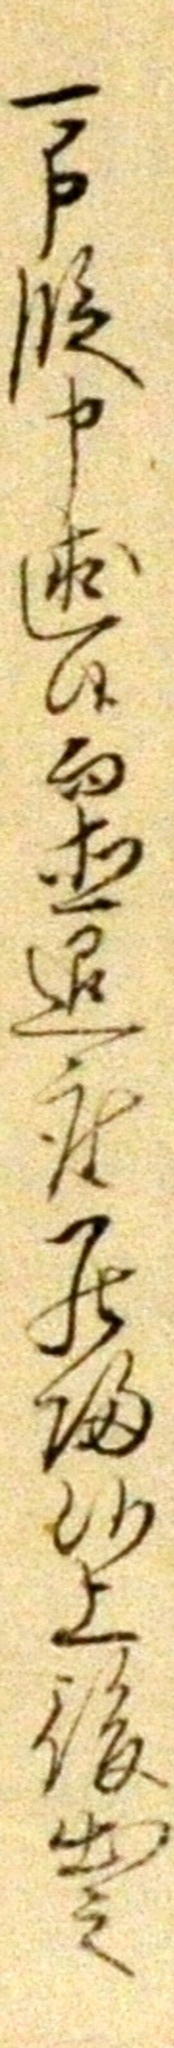可申段申述候而直退座罷帰候上後出之
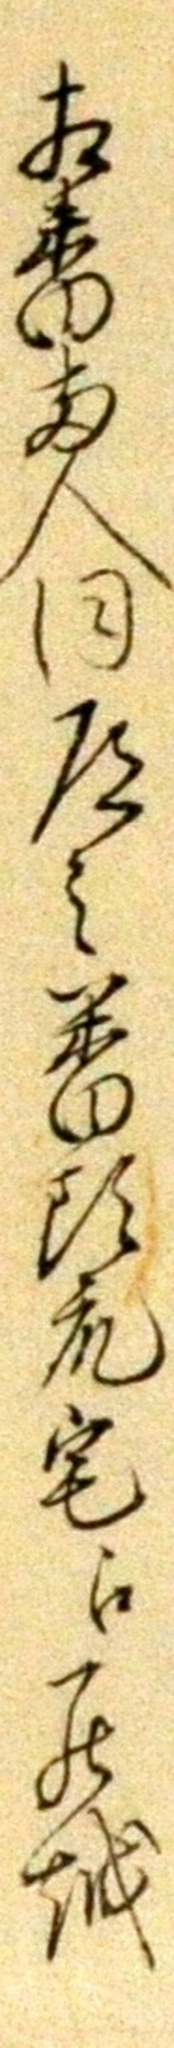相番両人同道之番頭衆宅え罷越
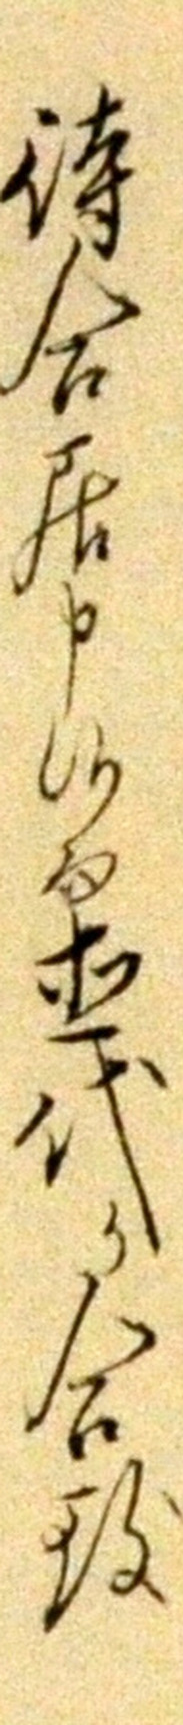待合居申候而直代り合致
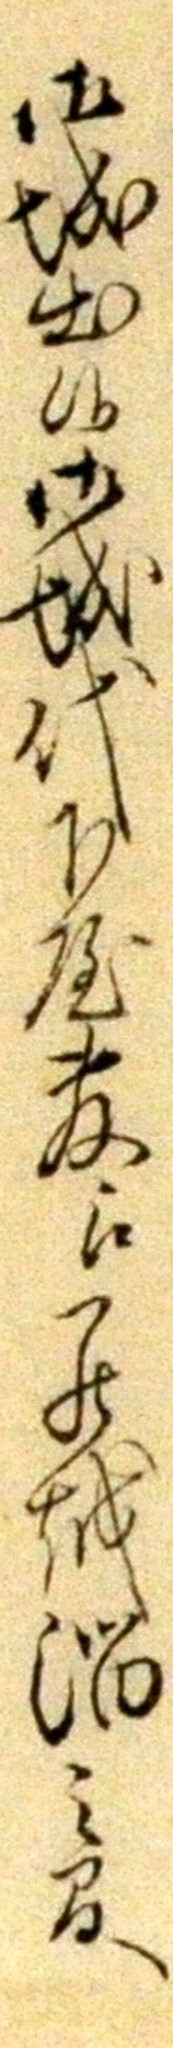御城出候御城代下屋敷え罷越溜之間へ
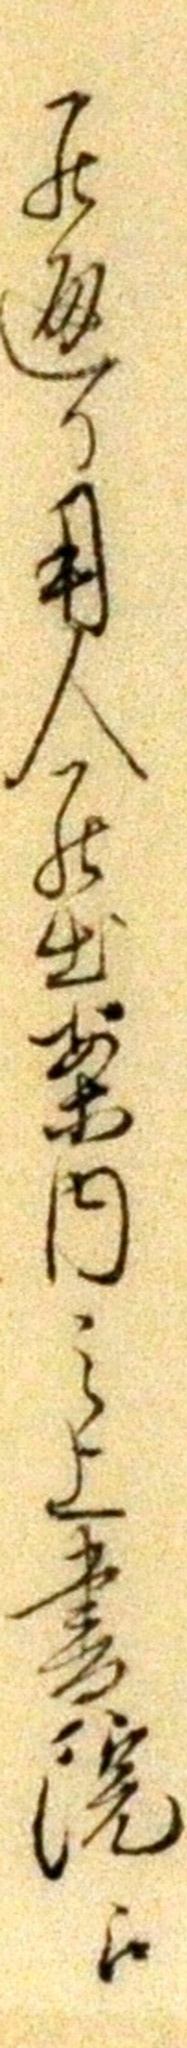罷通り用人罷出案内之書院え
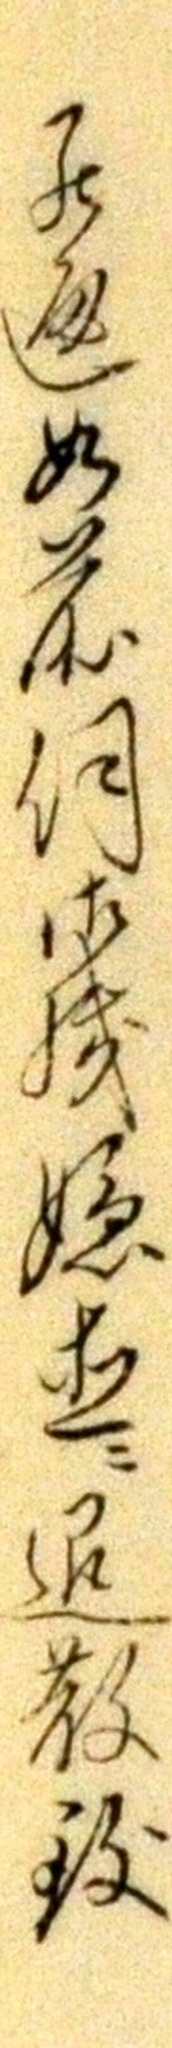罷通如前伺御機嫌直ニ退散致
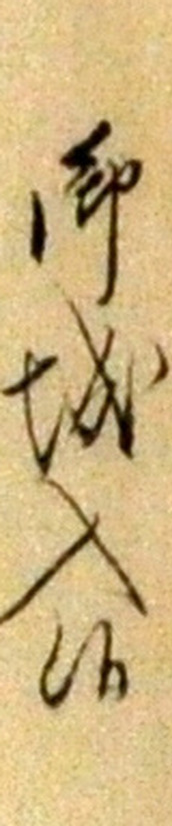御城入候
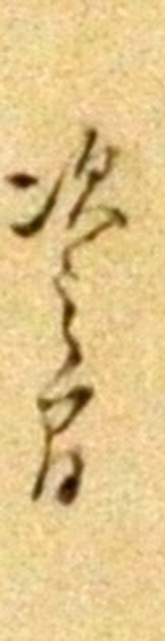次之間
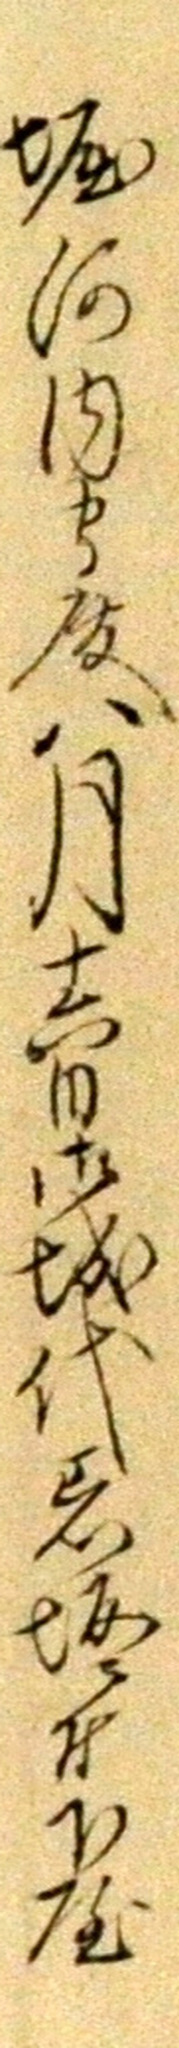堀河内守殿八月十六日御城代着坂ニ付下屋
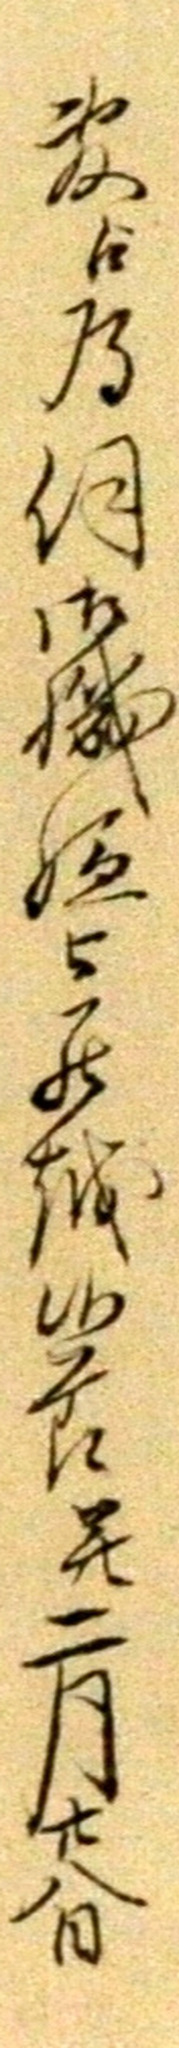敷え為伺御機嫌被罷越候節并二月廿八日
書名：大阪加番関係諸書留〔一括〕
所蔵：伊那市立高遠町図書館・合同会社AMANE
